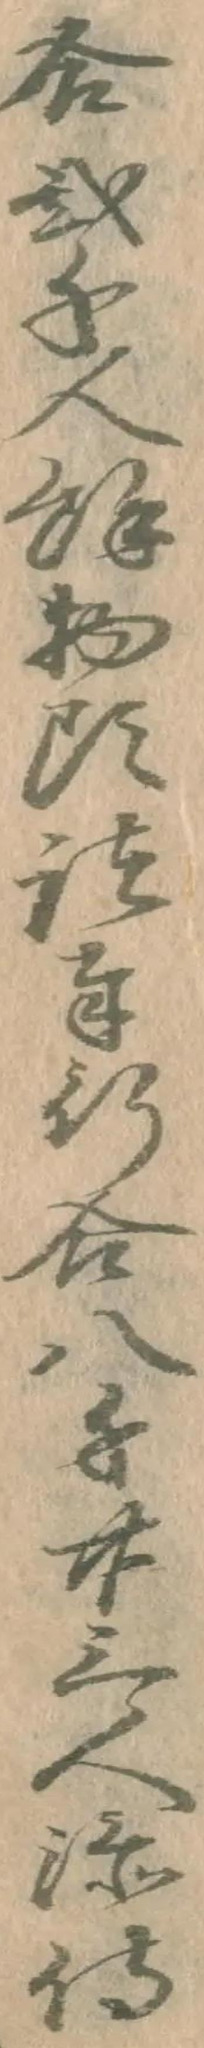合弐千人余物頭諸奉行合八千廿三人添侍
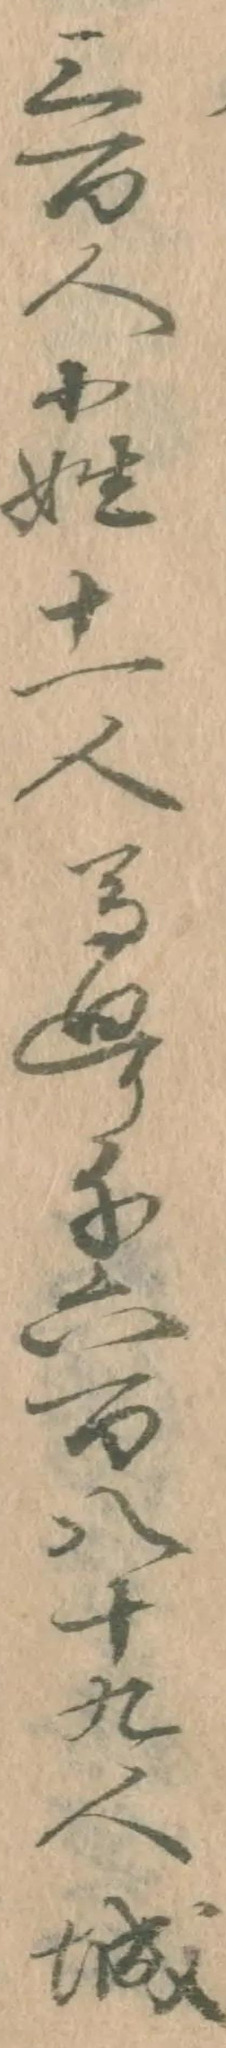三万人小姓十一人馬廻り千六百八十九人城
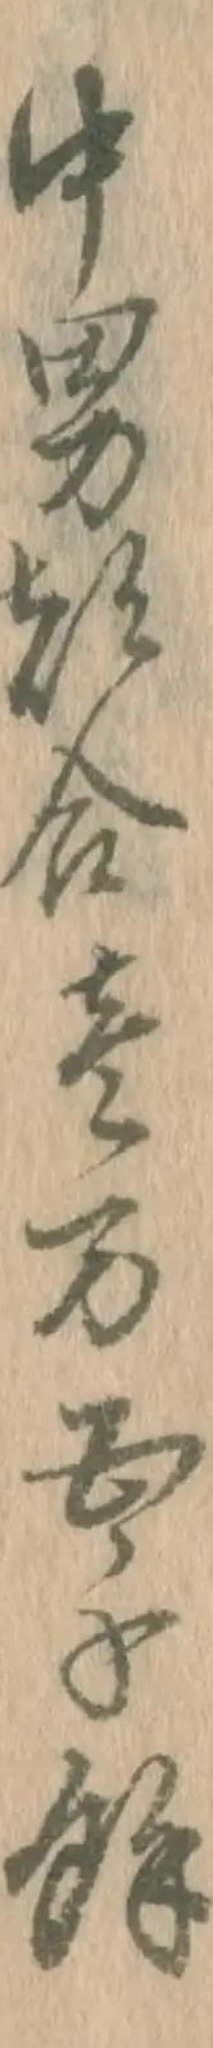中男都合壱万五千余
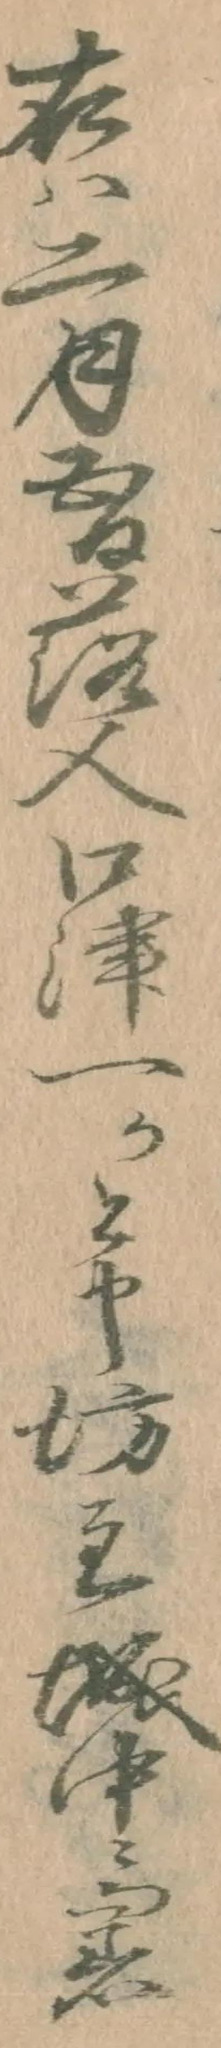右は二月五日落人口津一かと申坊主城中に而着
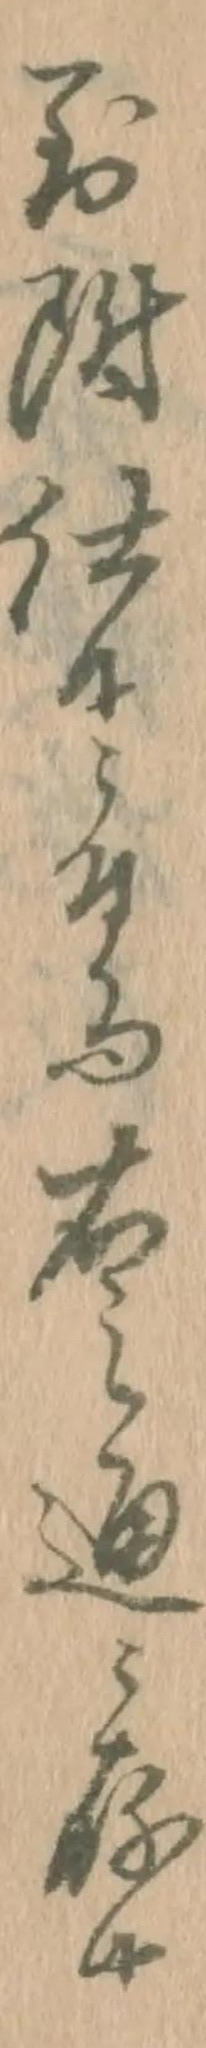到附仕候に付而右之通り存候
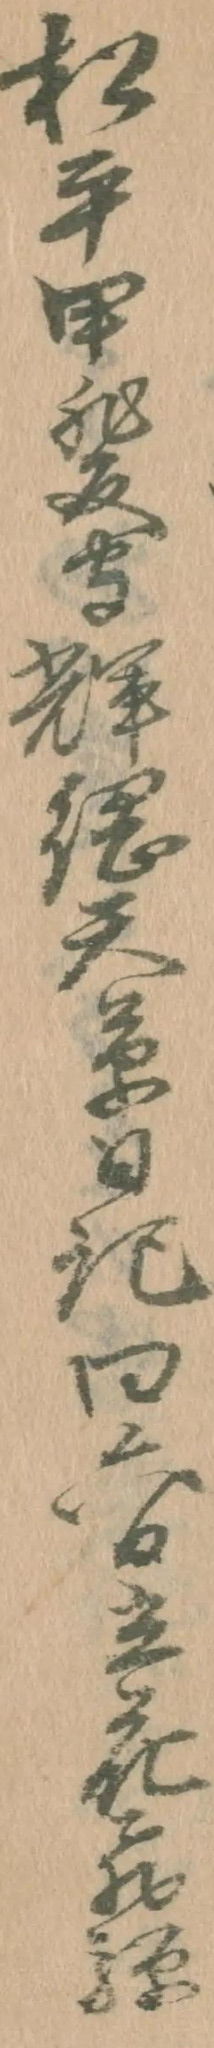松平甲斐守輝綱天草日記曰六日立花飛騨
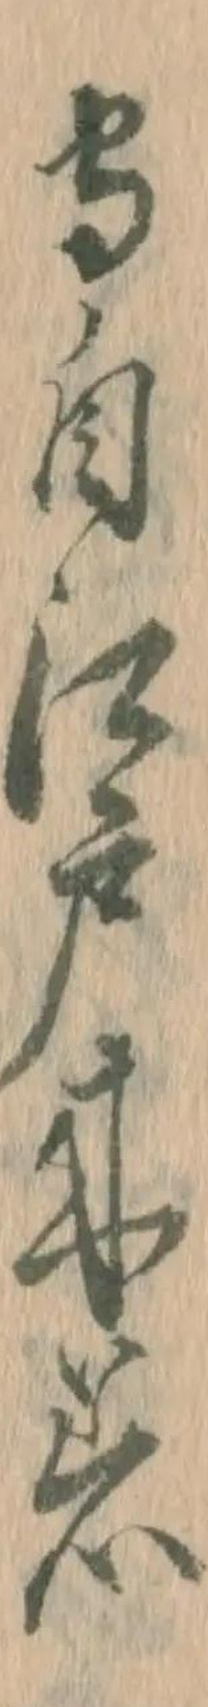守自江戸来着
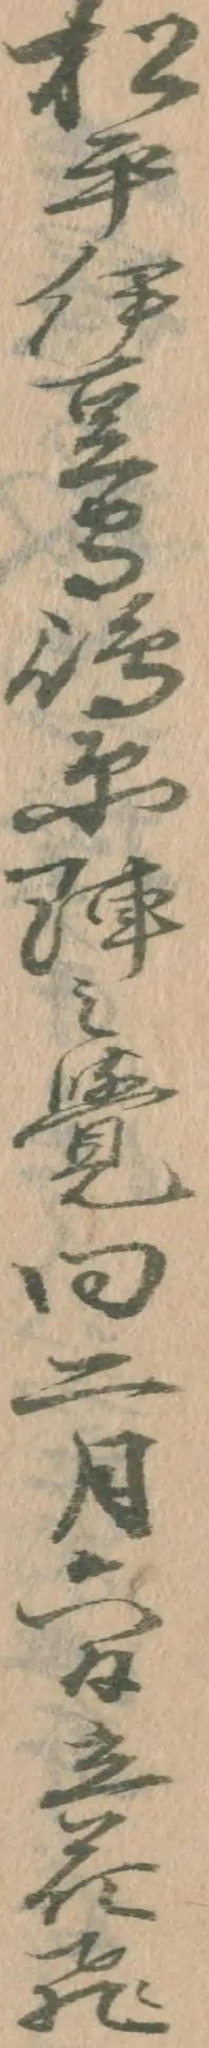松平伊豆守島原陣之覚曰二月六日立花飛
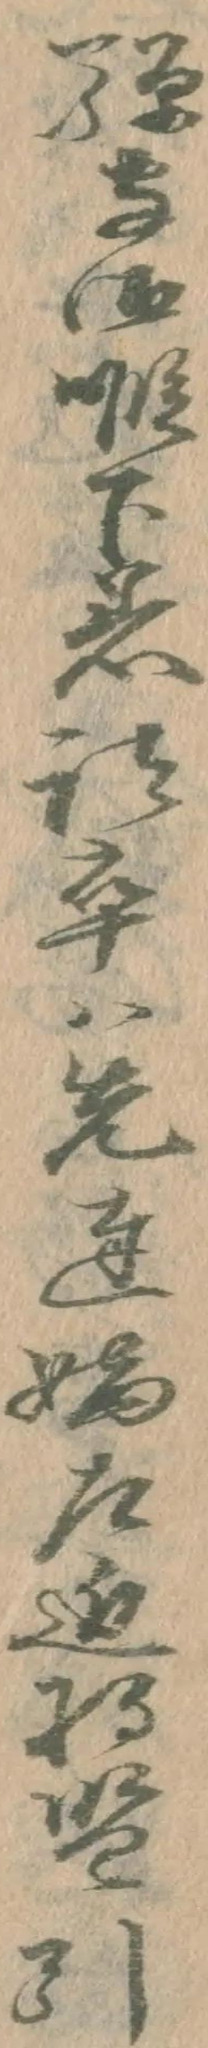騨守御順下着諸卒は先達婿左近将監引
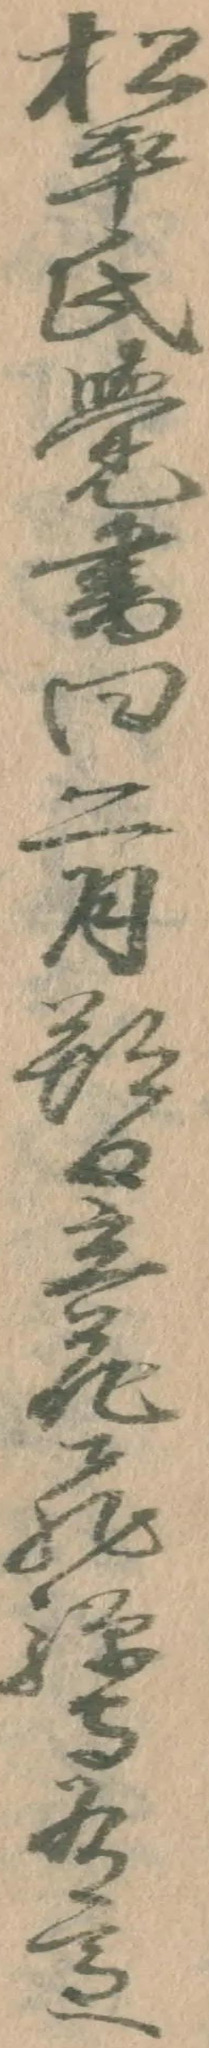松平氏覚書曰二月朔日立花飛騨守有馬へ
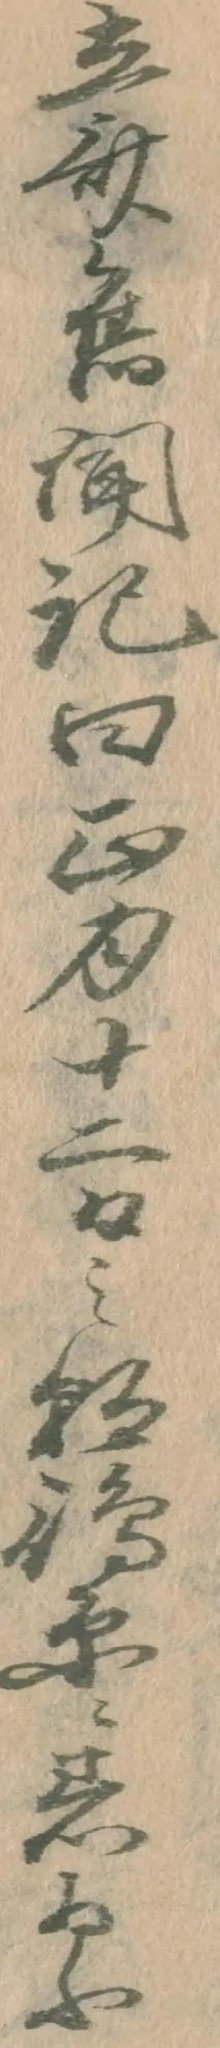立斎舊聞記曰正月十二日之朝島原に着ゐふ
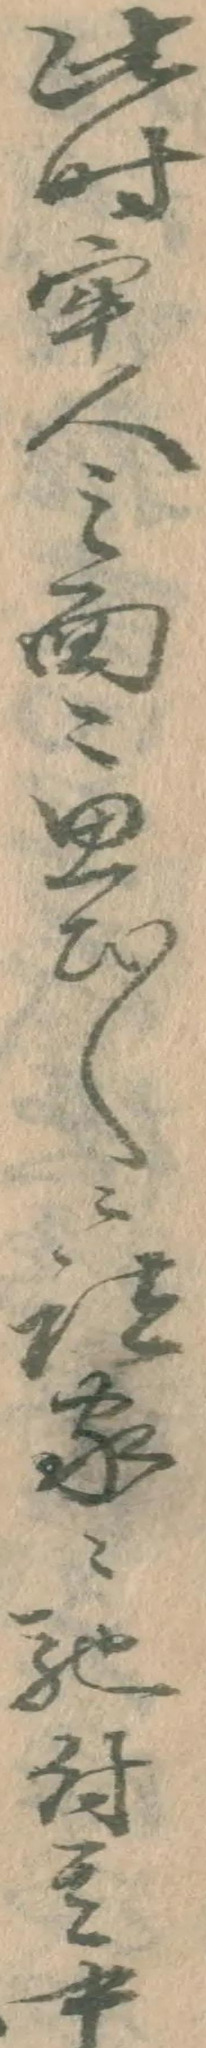此時牢人之面々思ひ〳〵に諸家に馳付其中
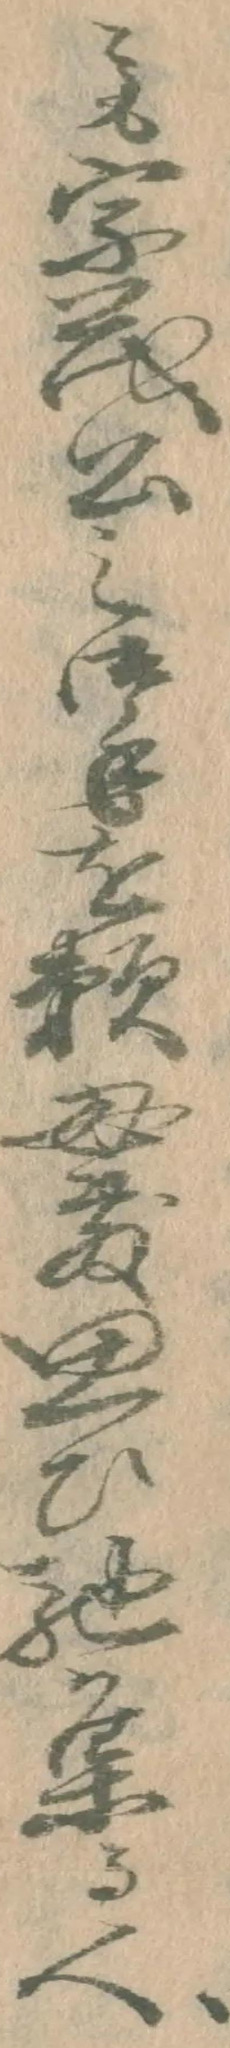にも宗茂公之御手を頼母敷思ひ馳集る人
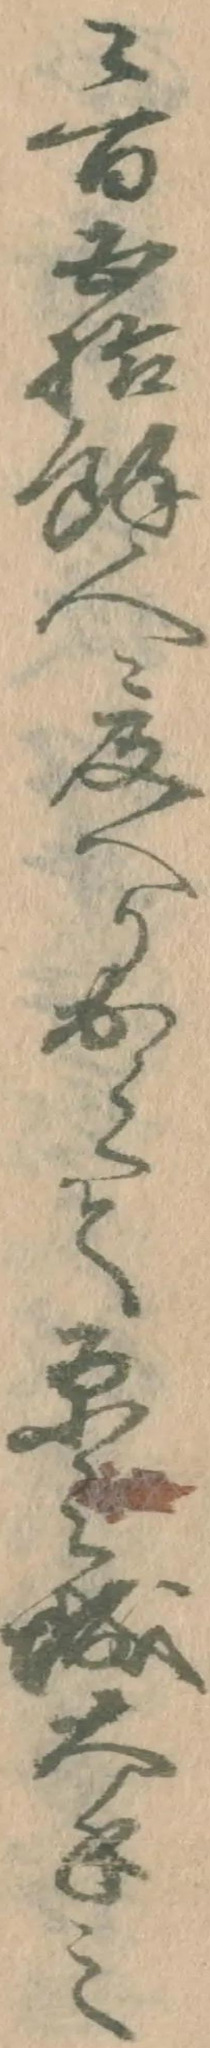に百五拾余人に及へりかくて原之城大手之

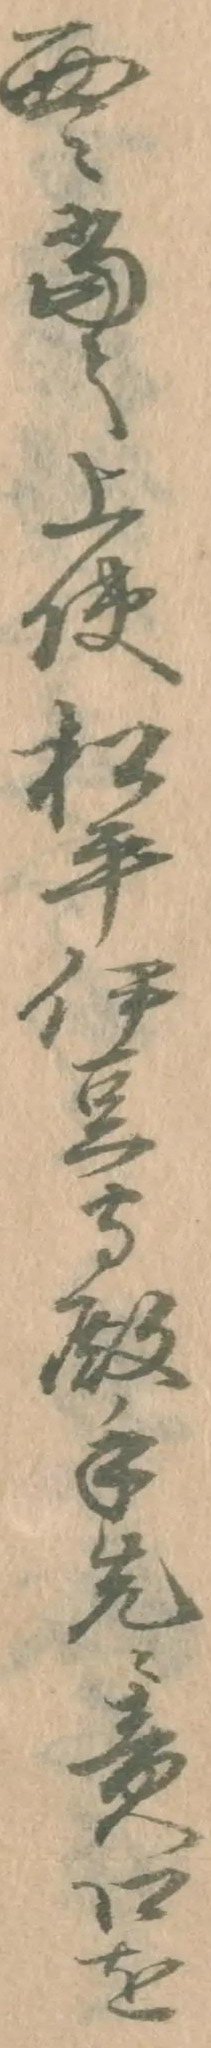西に当て上使松平伊豆守敵手先に責口を
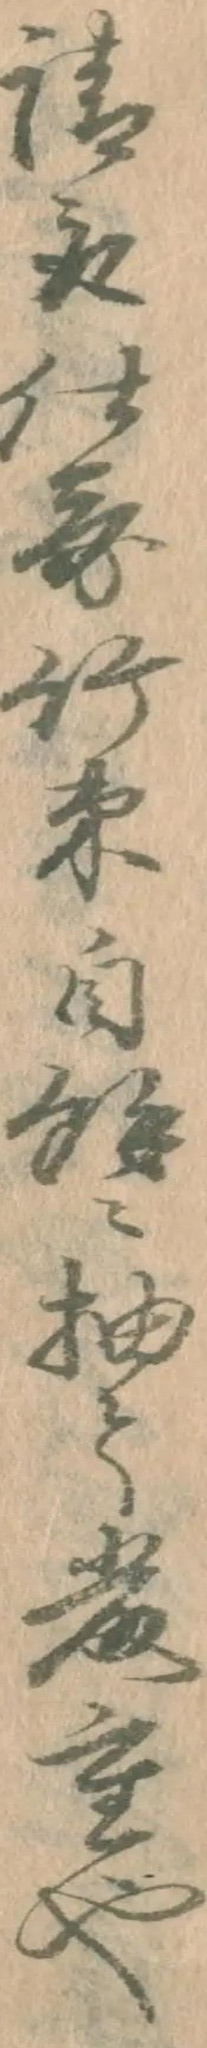請取仕寄竹束自余に抽て厳重也
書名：切支丹御退治記 49巻. [6]
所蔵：国立国会図書館 National Diet Library, JAPAN
